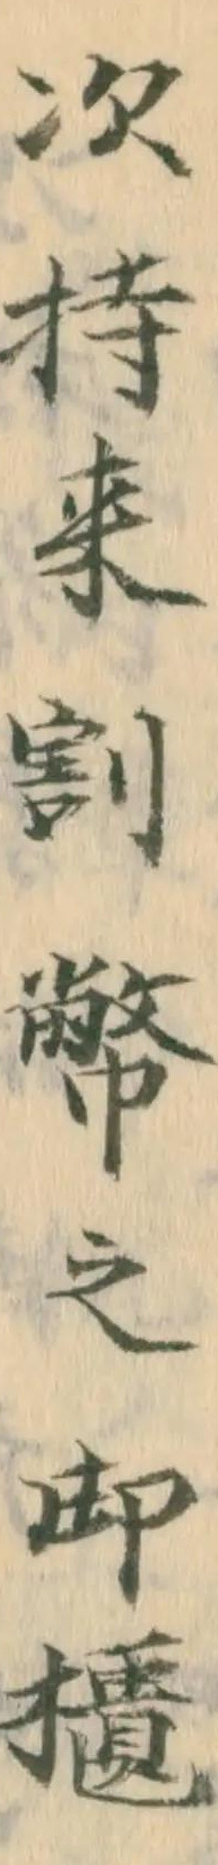次持来割幣之御櫃
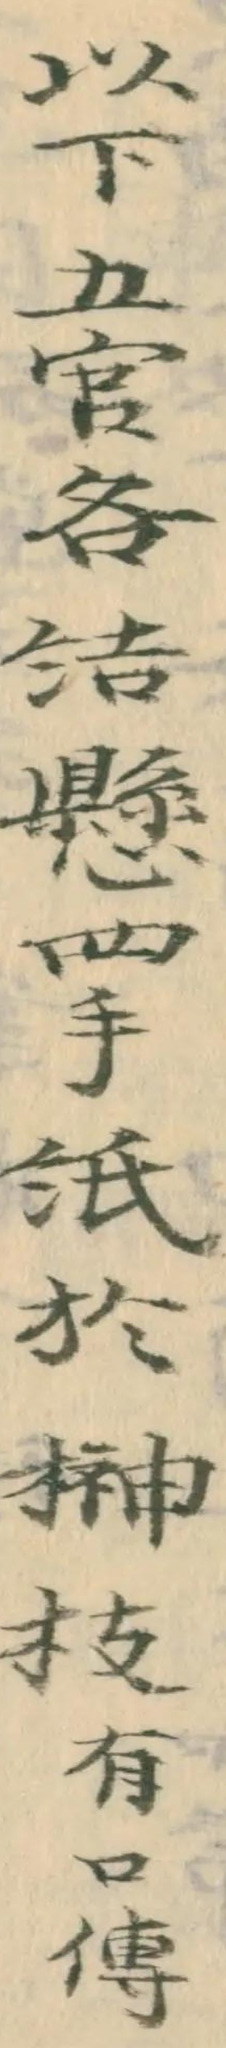以下五官各結懸四手紙於榊枝有口伝
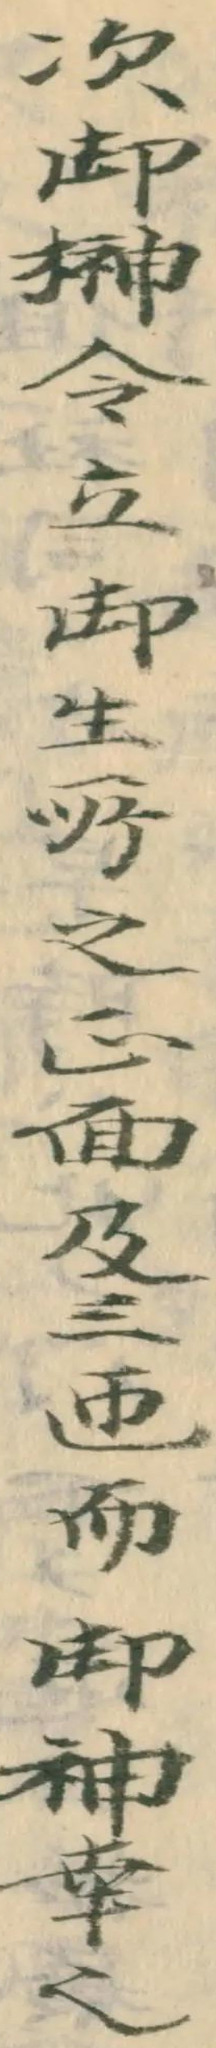次御榊令立御生所之正面及三画而御神幸也
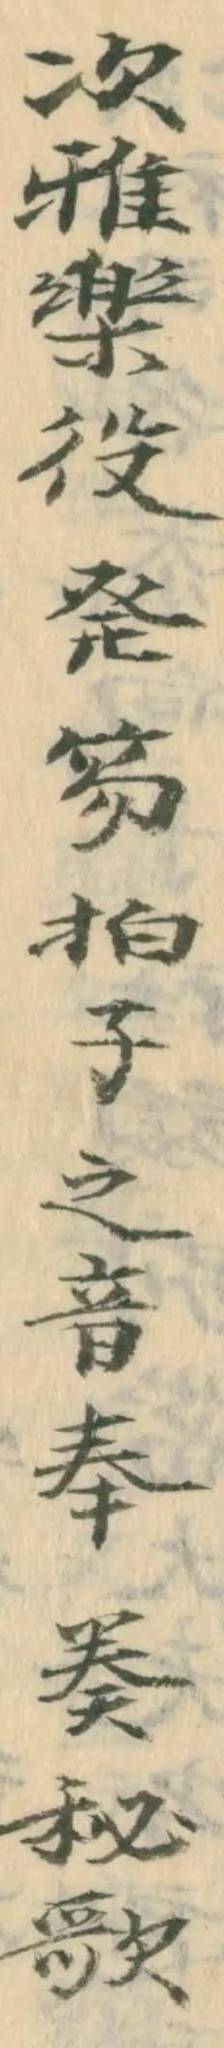次雅樂役発笏拍子之音奉奏秘歌
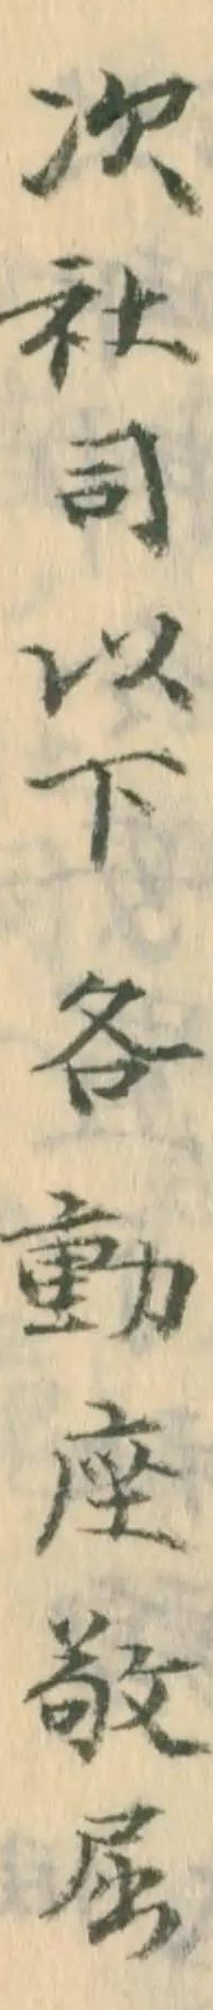次社司以下各動座敬屈

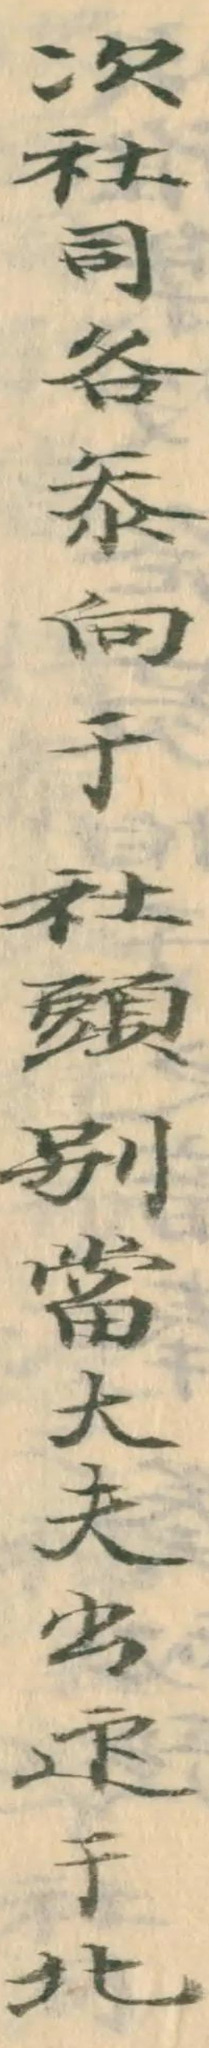次社司各参向于社頭別当大夫出迎于北
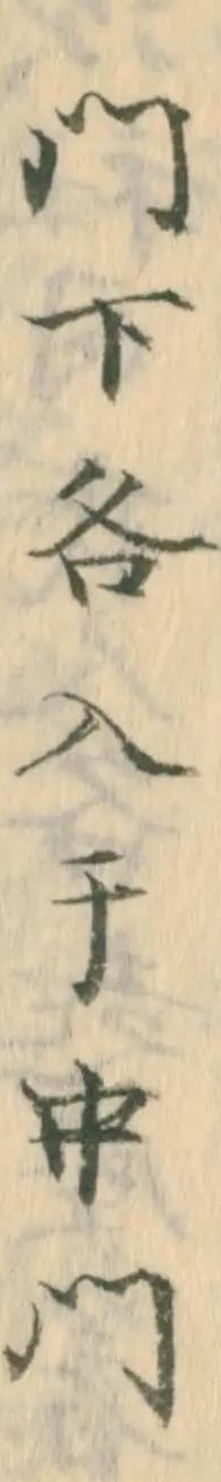門下各入于中門
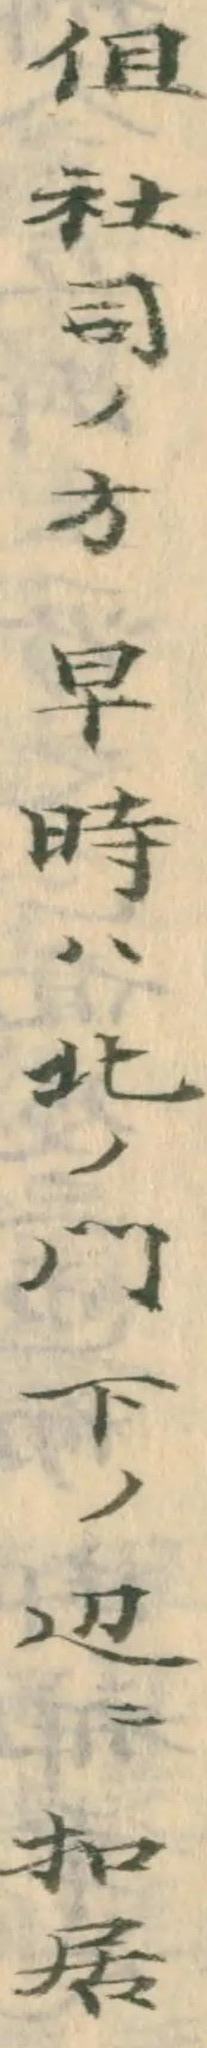但社司ノ方早時ハ北ノ門下ノ辺ニ扣居
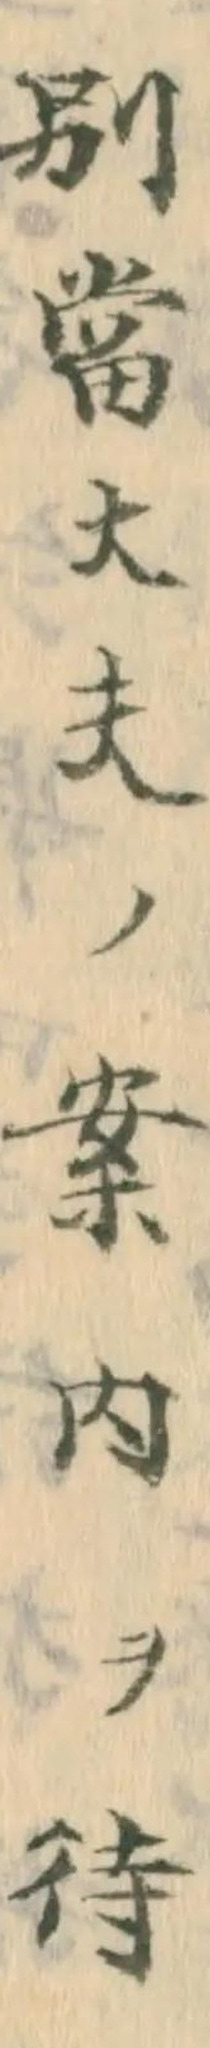別当大夫ノ案内ヲ待
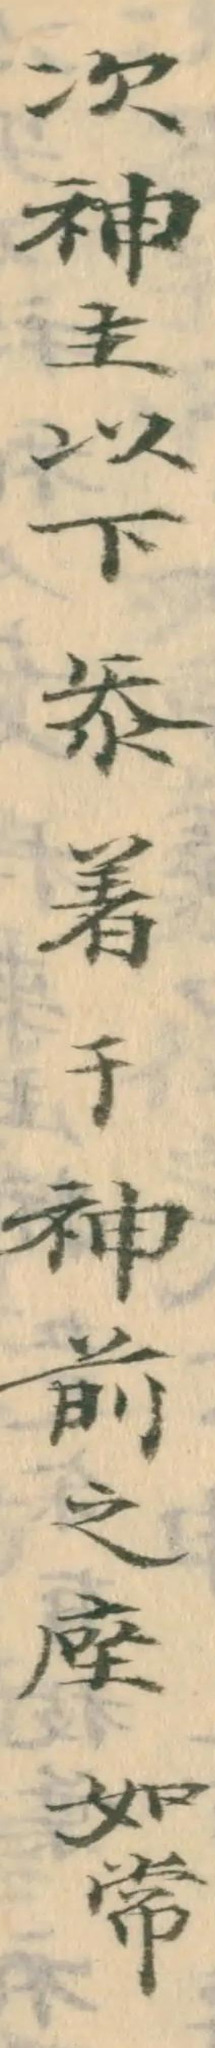次神主以下参着于神前之座如常
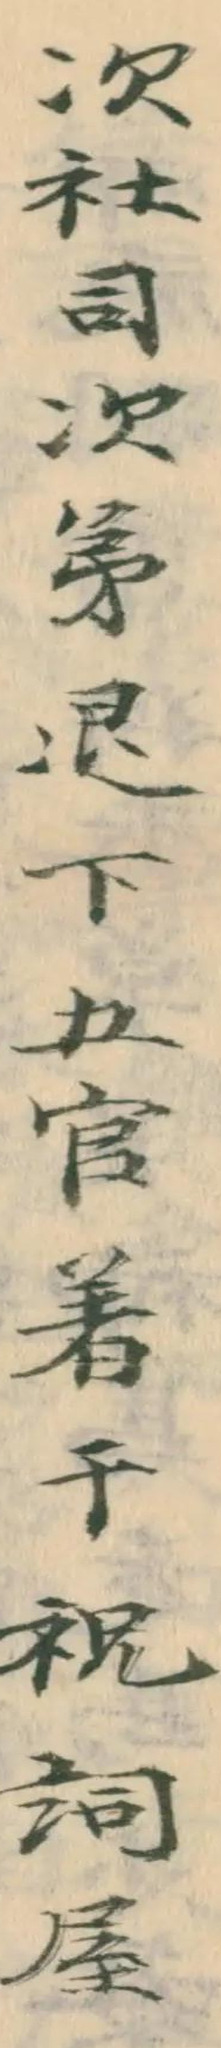次社司次第退下五官着于祝詞屋
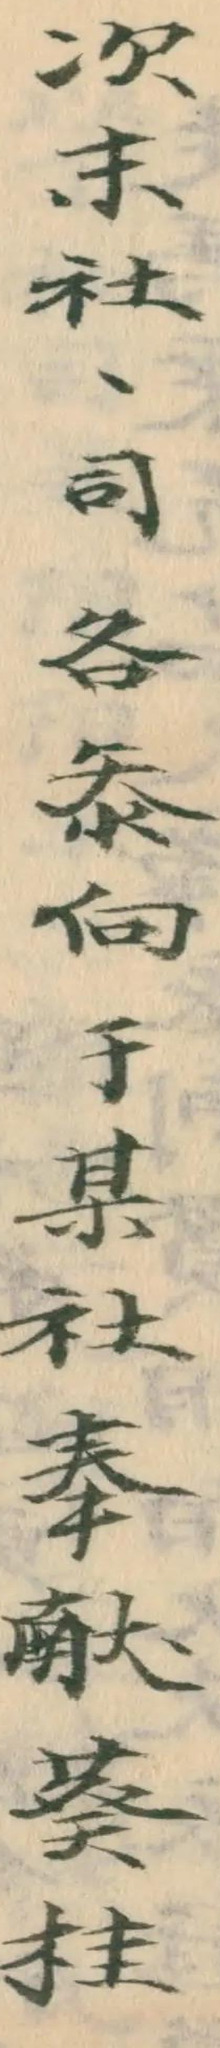次末社々司各参向于某社奉献葵桂
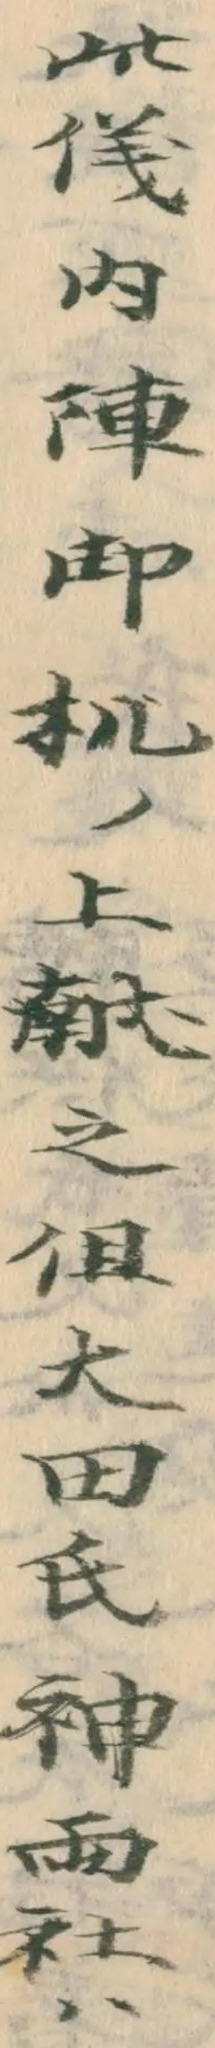此儀内陣御机ノ上献之但大田氏神両社ハ
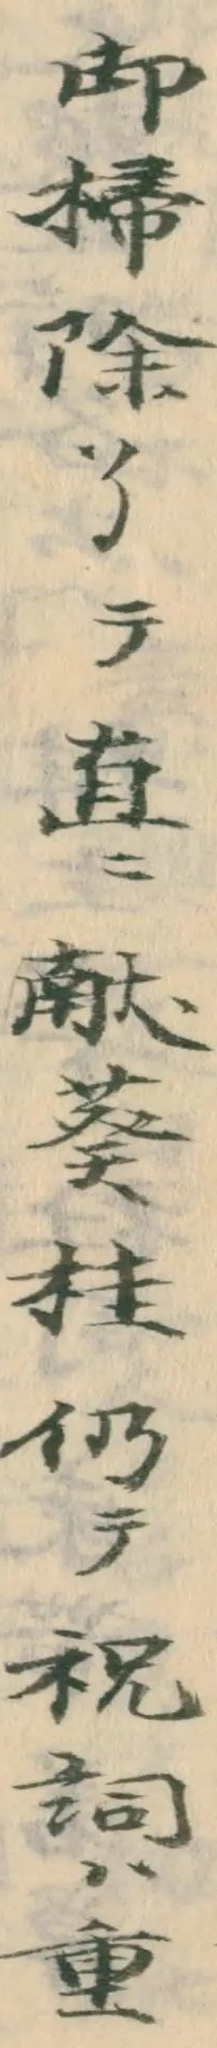御除了テ直ニ献葵桂仍テ祝詞ハ重
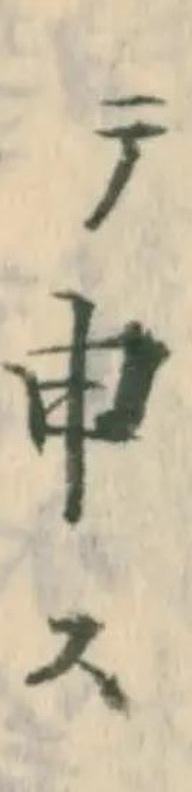テ申ス
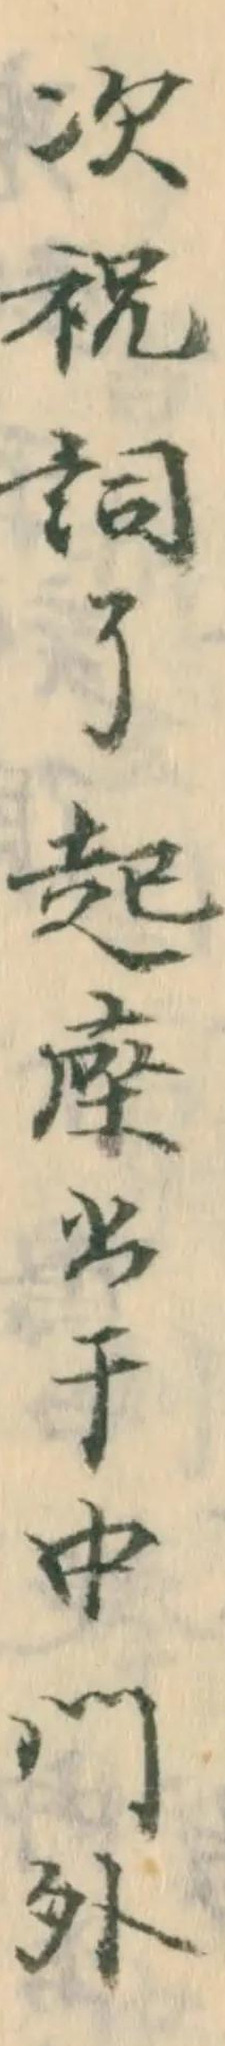次祝詞了起座出于中門外
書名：賀茂社記録. 第5冊
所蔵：国立国会図書館 National Diet Library, JAPAN
